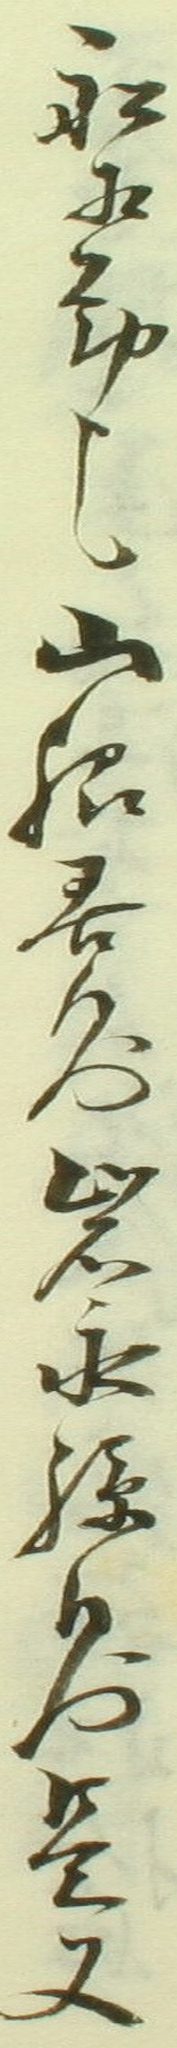船相勤申候山脇善左衛門岩永孫左衛門是又
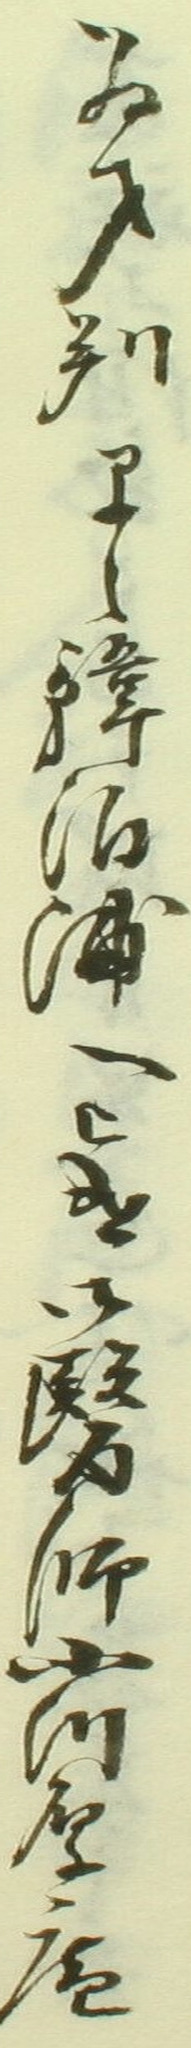為才判早々韓泊浦へ被遣御医師小川厚庵
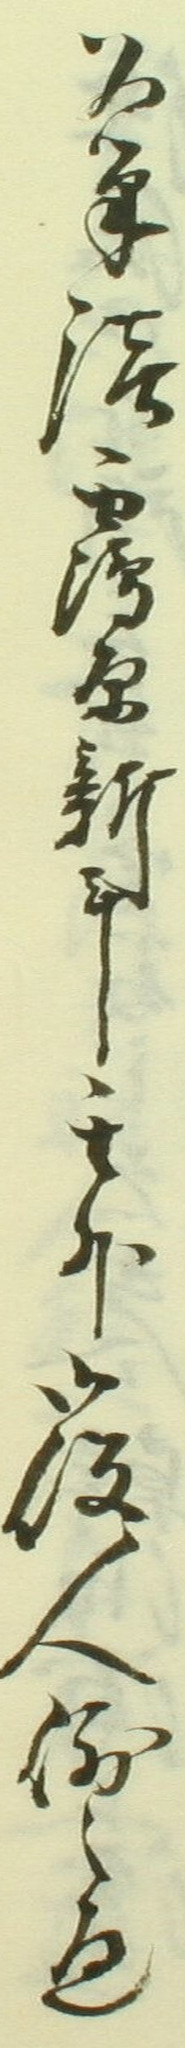為筆談鶴原新平其外御役人例之通
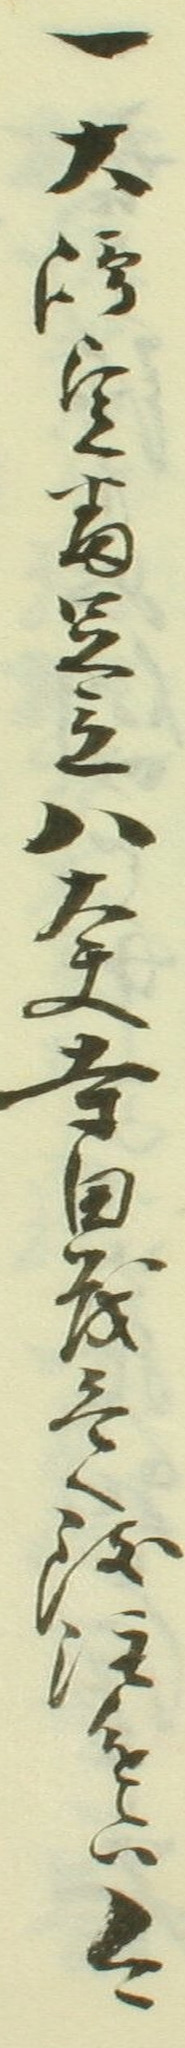一大嶋定番足立八大夫寺田茂兵へ致注進候ハ今
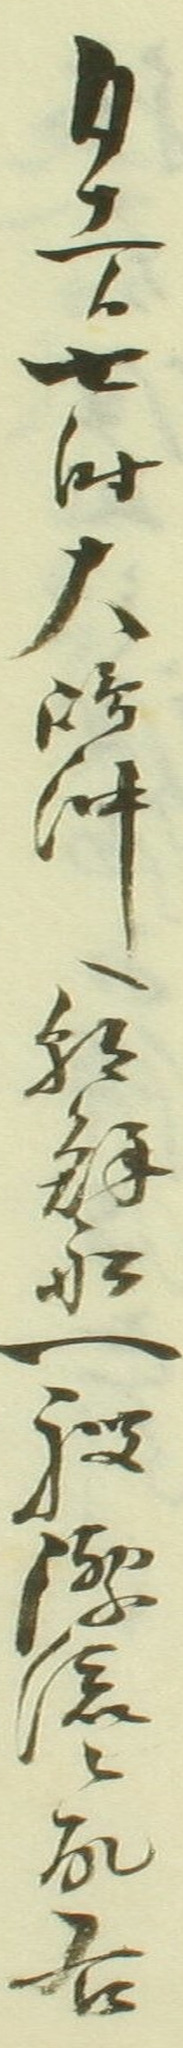月十一日七時大嶋沖へ朝鮮船一艘漂流之故右
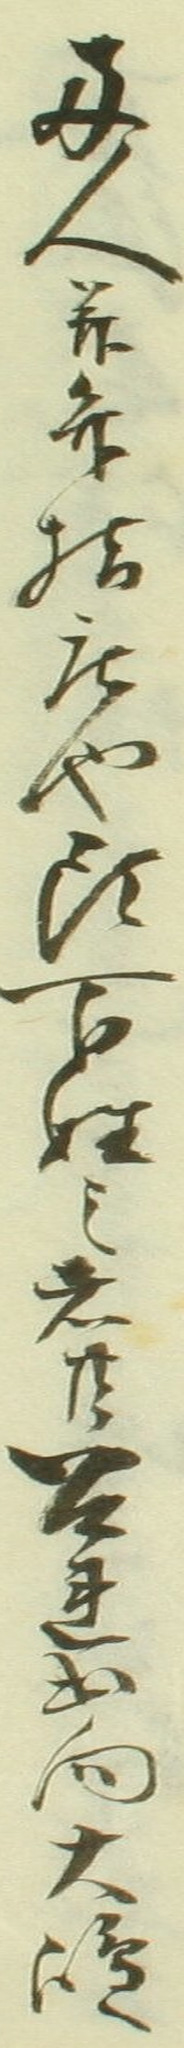両人并弁指庄や頭百姓之者共召連出向大嶋へ
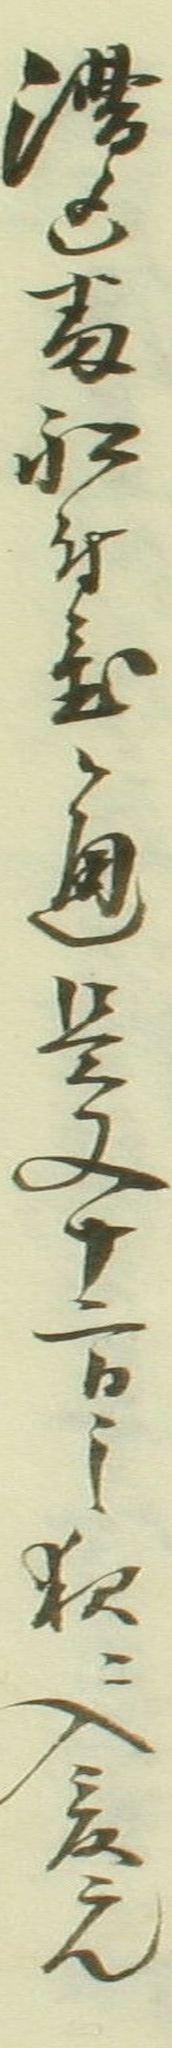漕込番船付置候通是又十二日之夜ニ入爰元
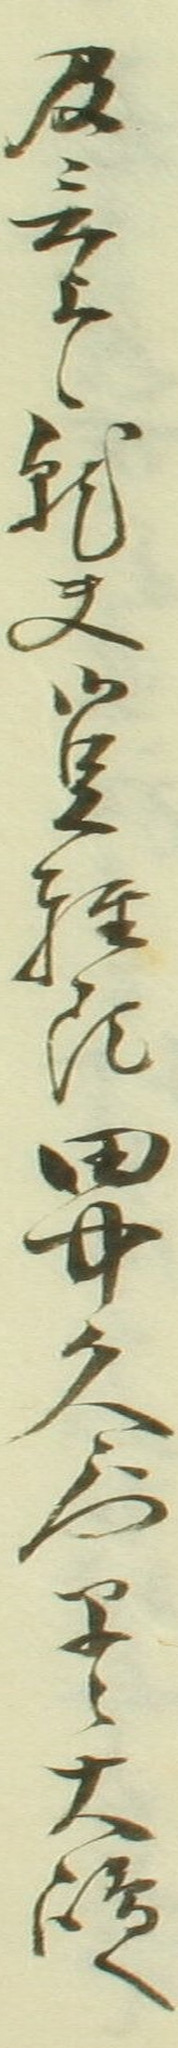及言上候就夫御足軽頭田中久右衛門早々大嶋へ
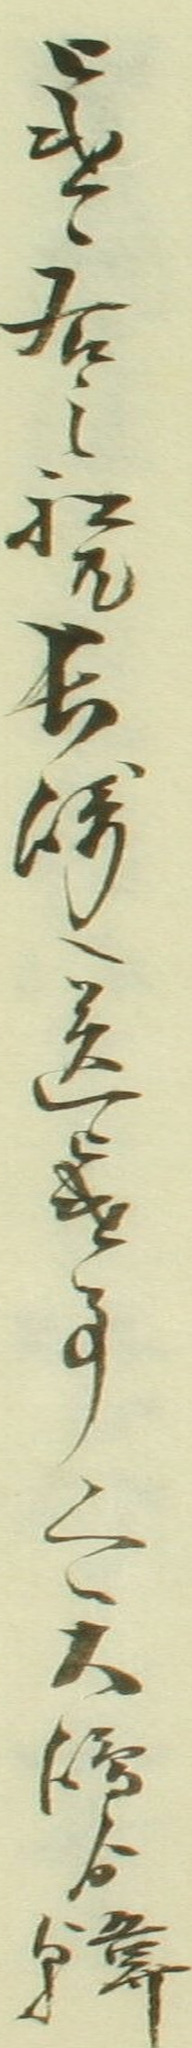被遣候右之船共長崎へ送被遣事今大嶋ゟ韓
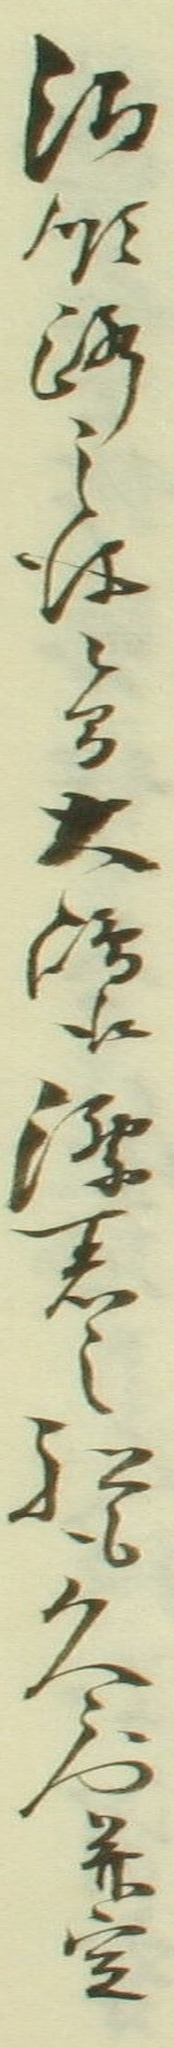泊順路之儀候間大嶋江漂着之船も久右衛門并定
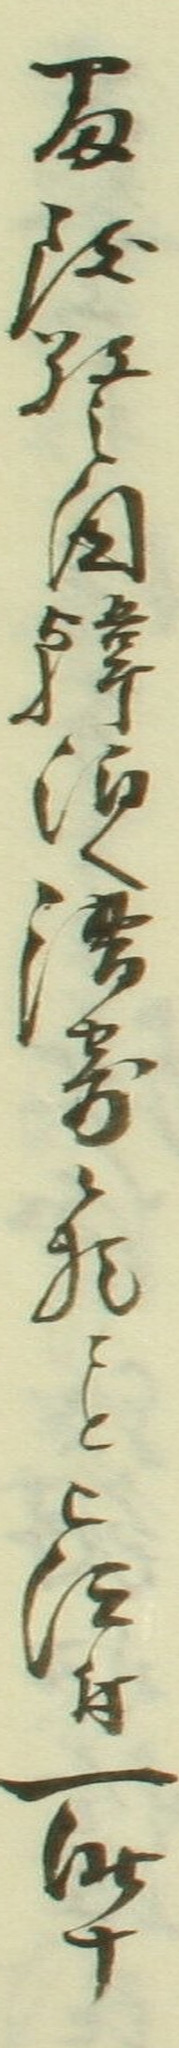番致警固韓泊へ漕寄候様ニと被仰付一昨十
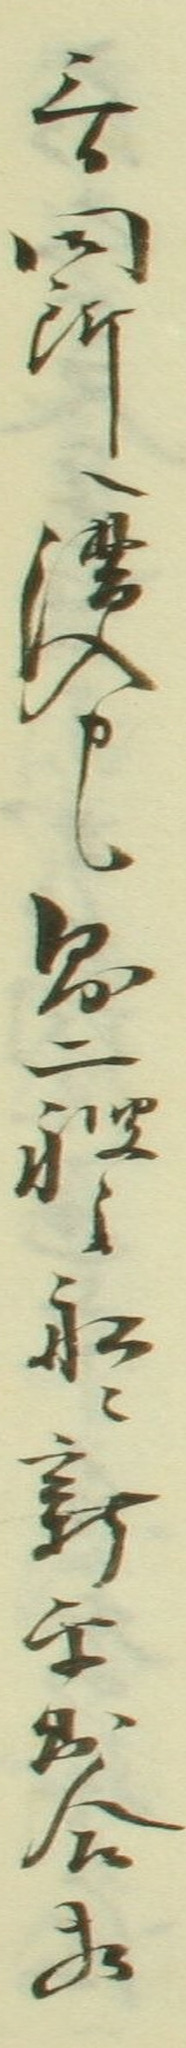三日同所へ漕入申候則二艘之船二新に出合相

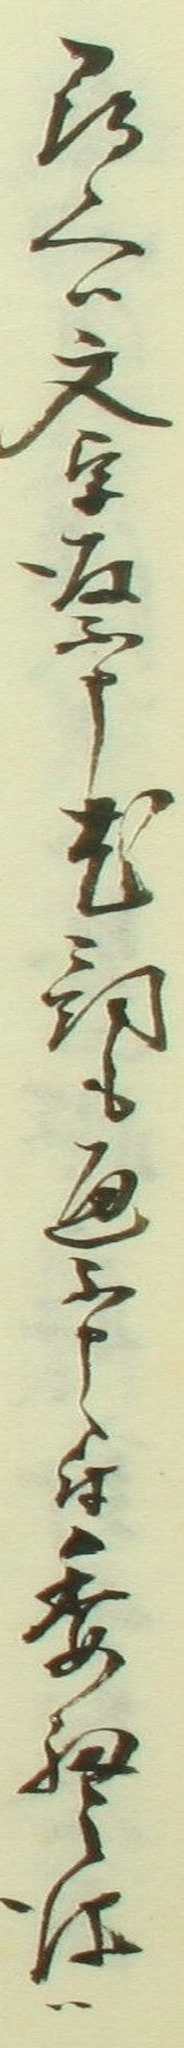尋候へハ文字存不申尤詞も通不申候付委細之儀ハ
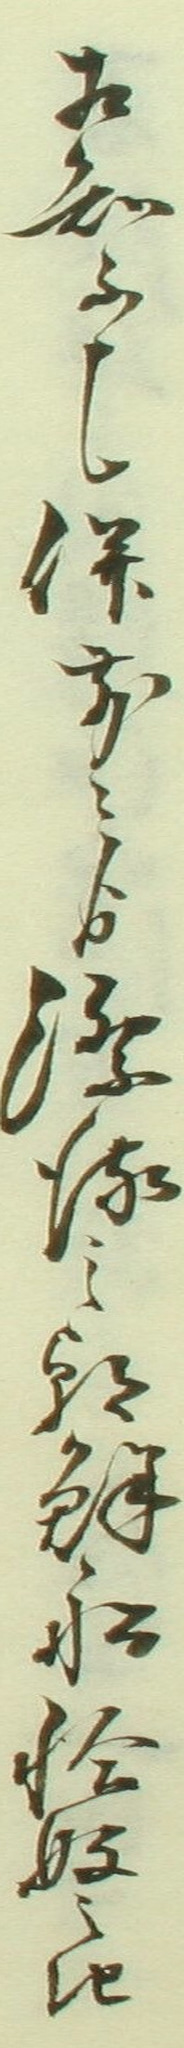相知不申候併前々ゟ漂流之朝鮮船恰好之由
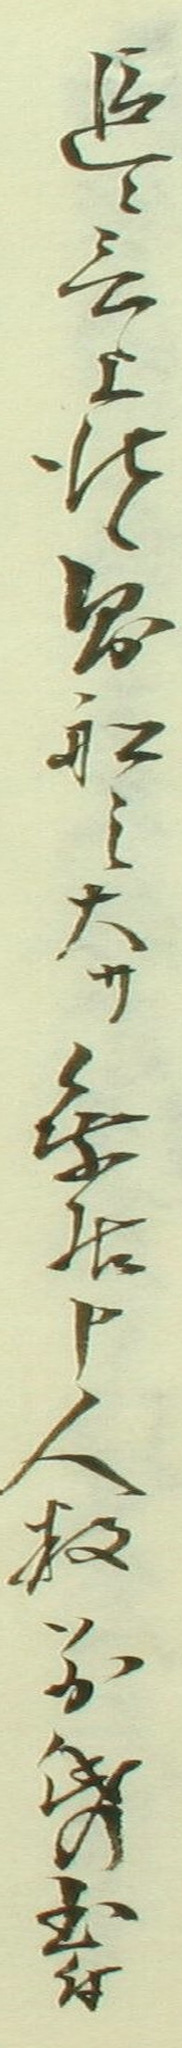追々言上仕候則船之大サ乗居申人数別紙の書付
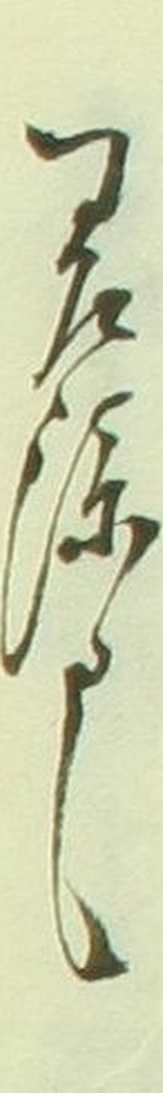差添申候
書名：異国船漂着記
